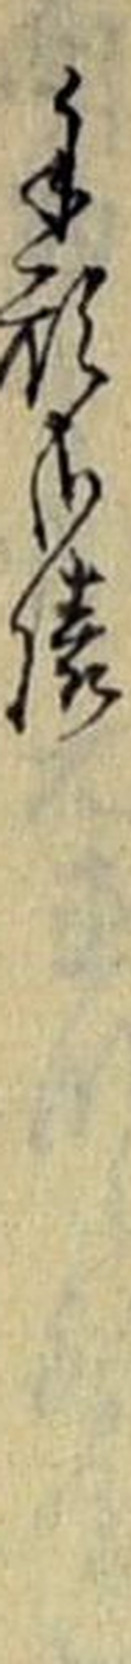手形弐俵
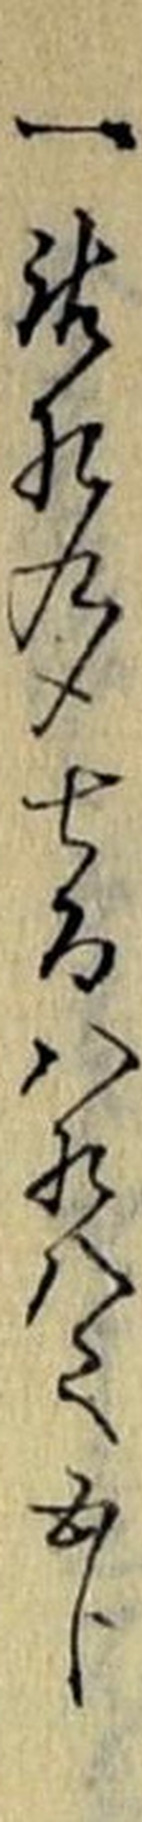一銀拾九貫七百八拾八匁五分中領
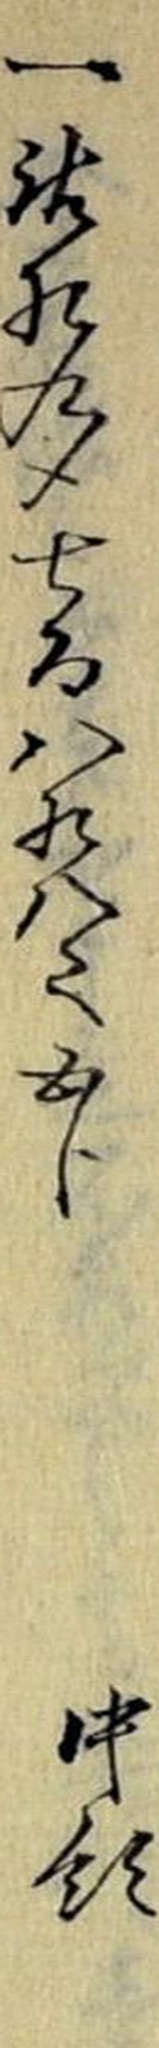一銀拾九貫七百八拾八匁五分中領
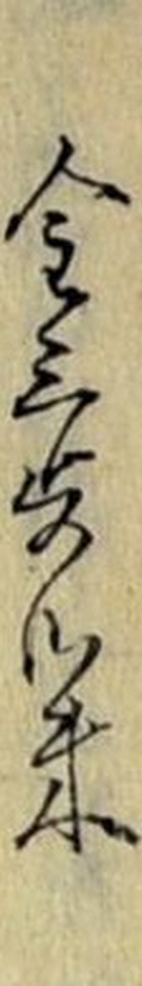金三歩弐朱
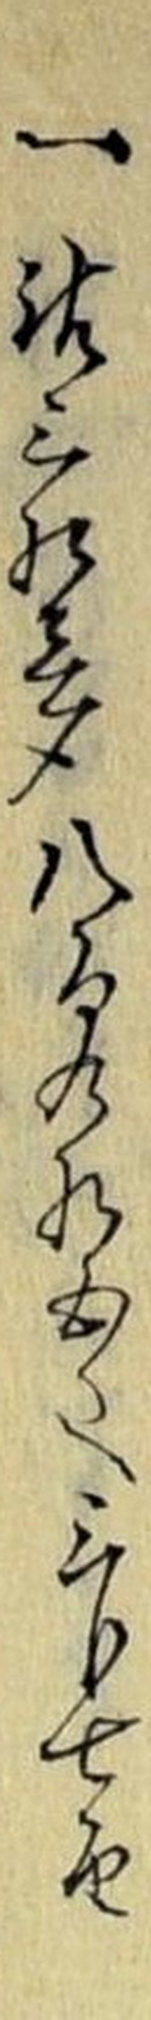一銀三拾壱貫八百九拾五匁三分七厘下領
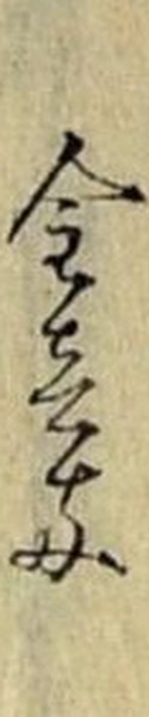金壱両
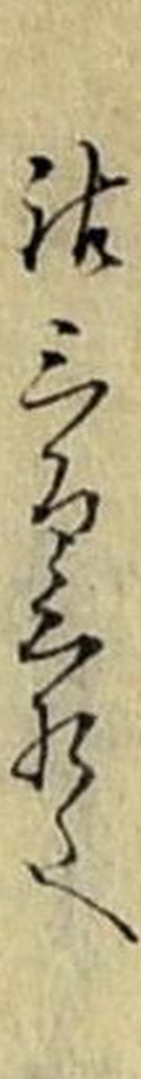銀三百三拾匁
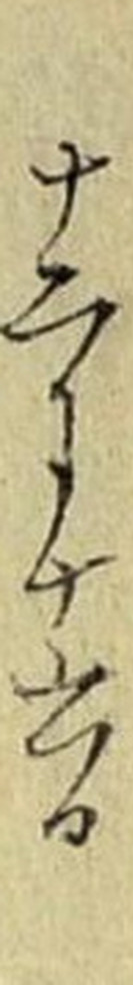十二月十六日

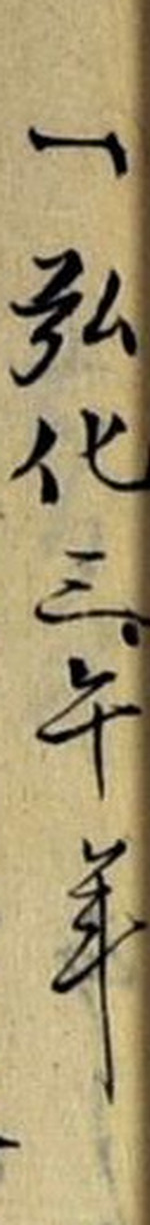一弘化三午年
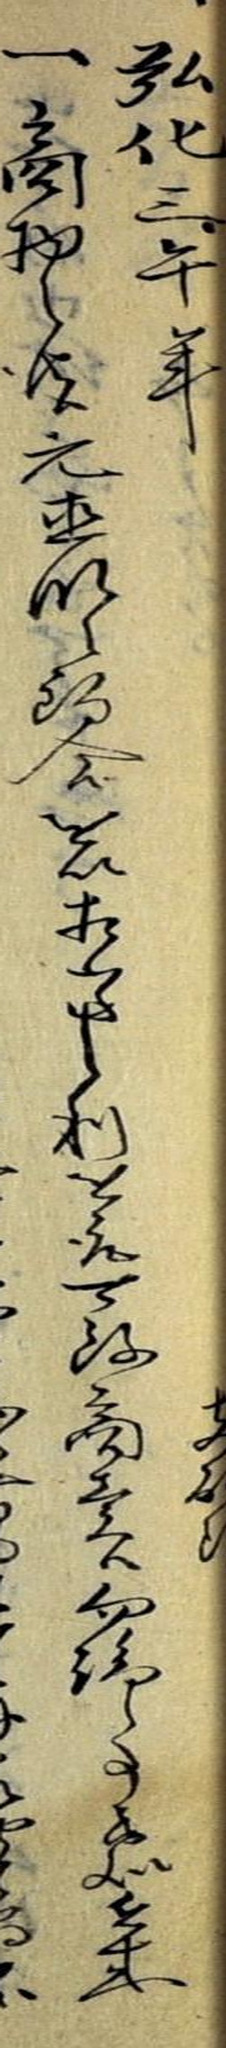一商物之儀元値段釣合を以相当之利を取可致商売は勿論之事に候処近来
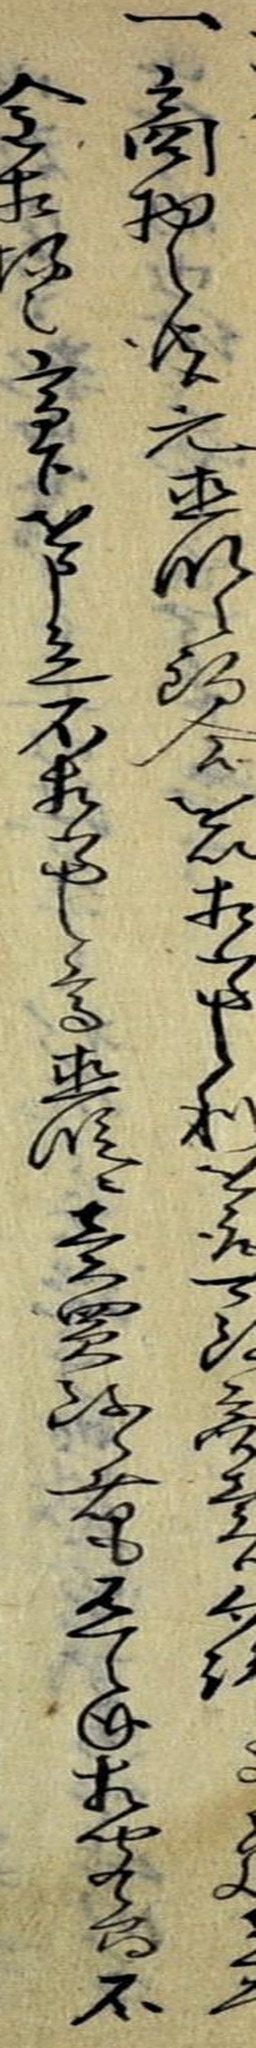金相場之高下を申立不相当之高直段に売買致候者も有之趣相聞候間不
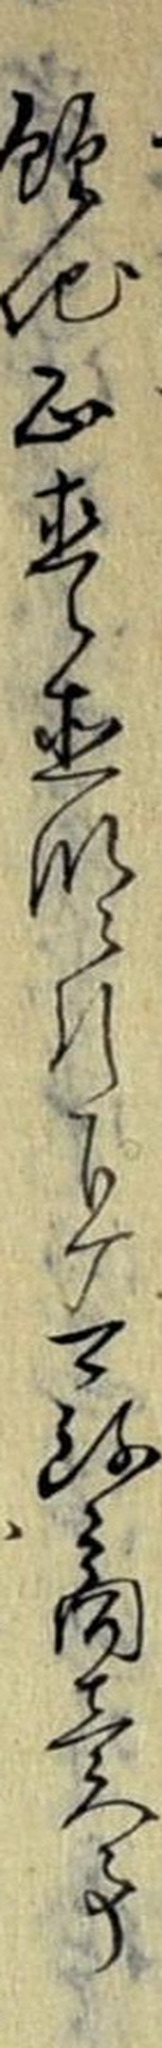顧他正直之直段に引下ヶ可致商売事
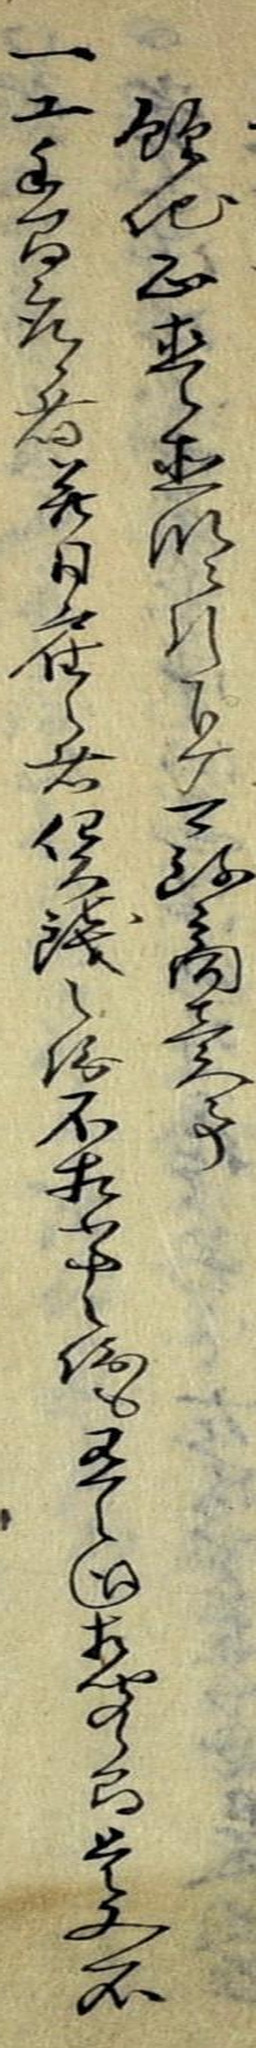一工手間取之者并日雇之者賃銭之儀不相当之儀も有之趣相聞候間是又不
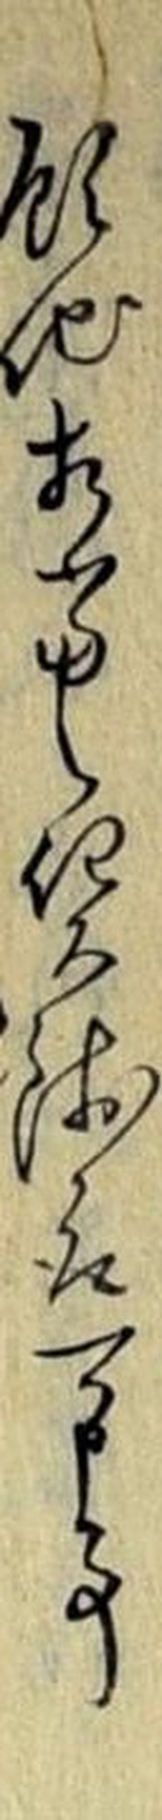顧他相当之賃銭取可申事
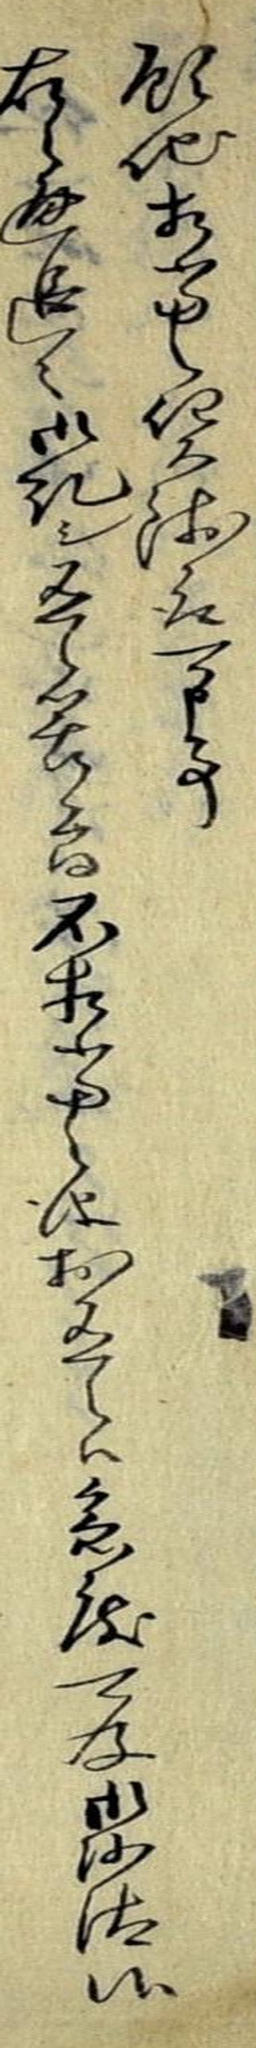右之通追々御糺シ有之筈候間不相当之儀おゐては急度可及御沙汰候
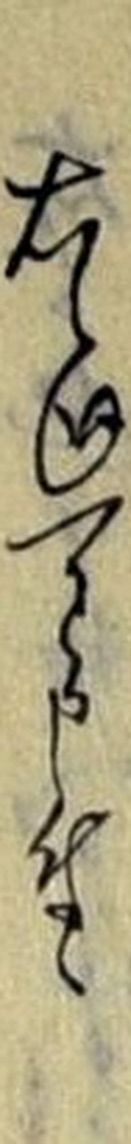右之趣可被申付候
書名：命令之部 六
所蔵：福井県文書館 Fukui Prefectural Archives
